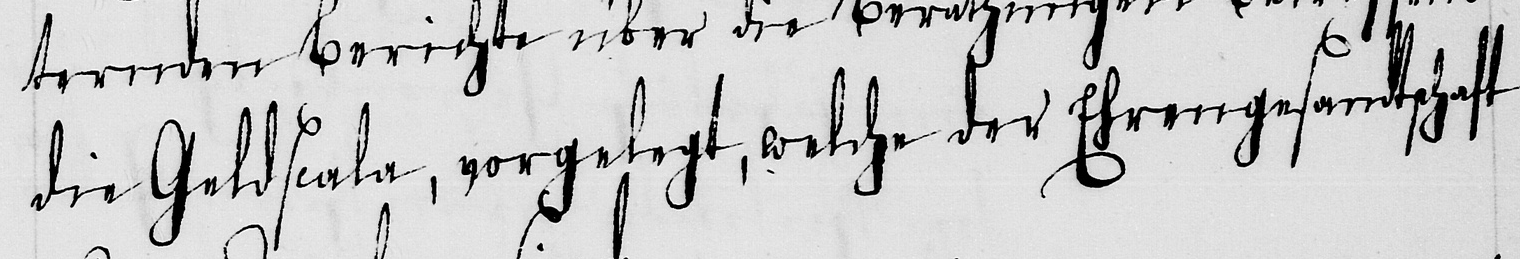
die Geldscala, vorgelegt, welche der Ehrengesandtschaft
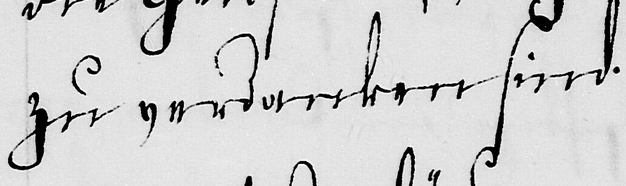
zu verdanken sind.
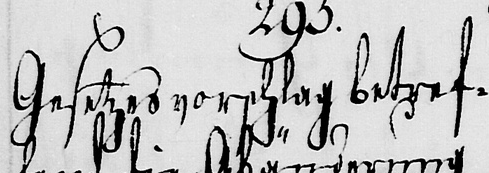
Schweizerischen
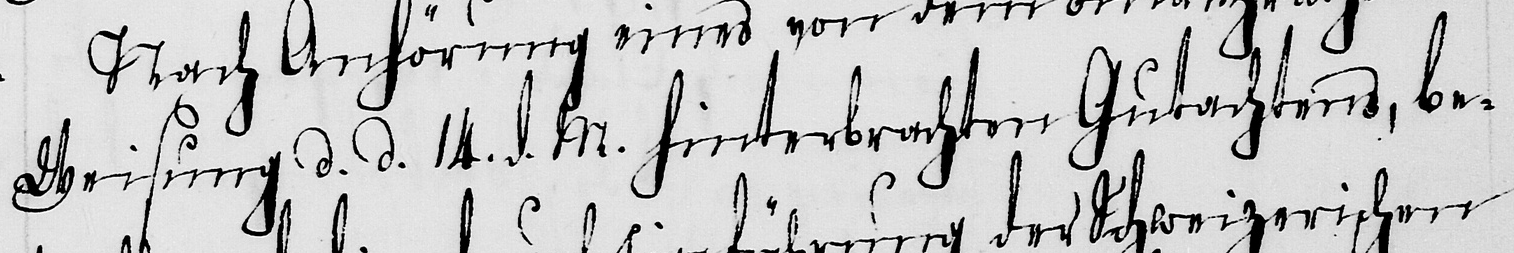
Weisung d. d. 14. d. M. hinterbrachten Gutachtens, be¬
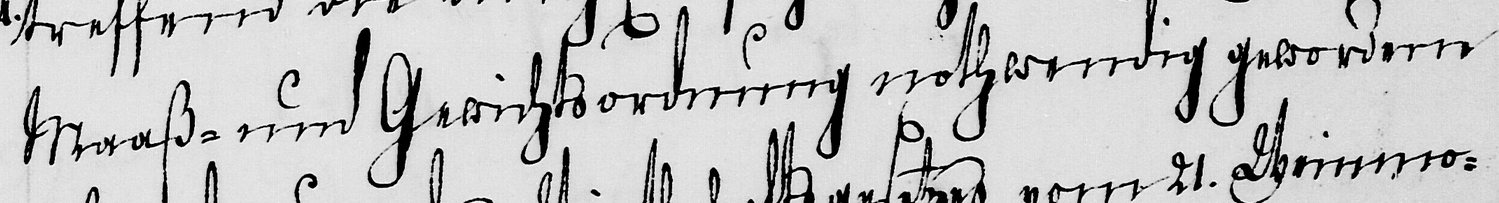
Maaß- und Gewichtsordnung nothwendig gewordene
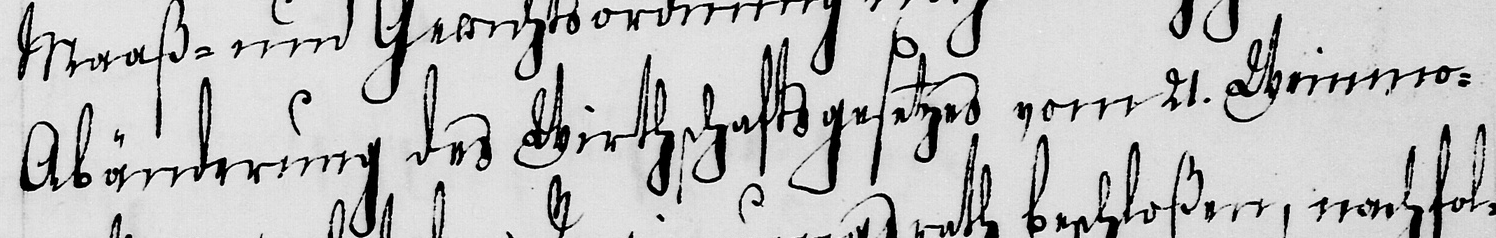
Abänderung des Wirthschaftsgesetzes vom 21. Weinmo¬
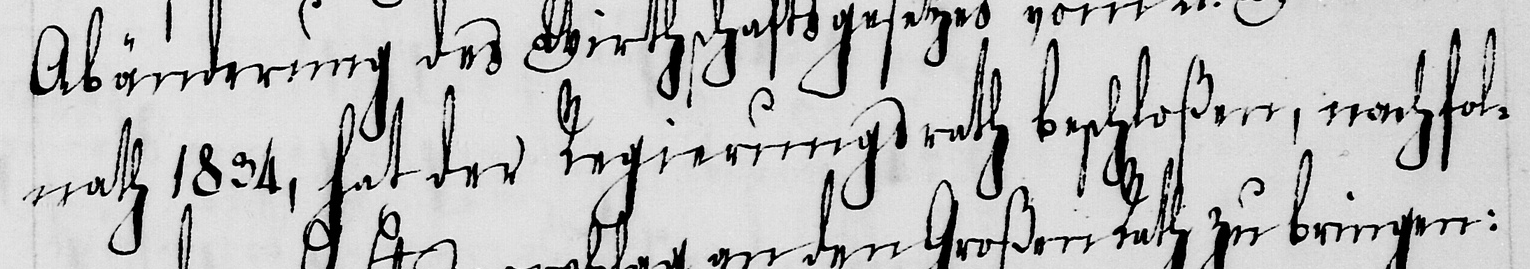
nath 1834, hat der Regierungsrath beschloßen, nachfol¬
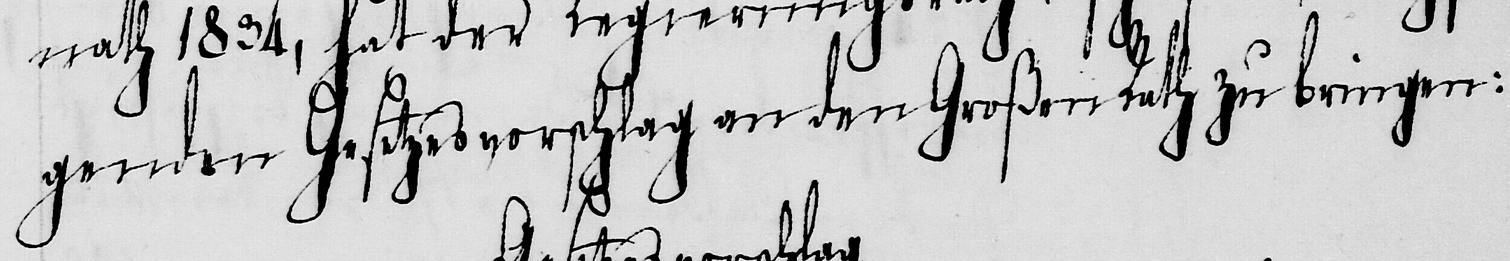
genden Gesetzesvorschlag an den Großen Rath zu bringen:
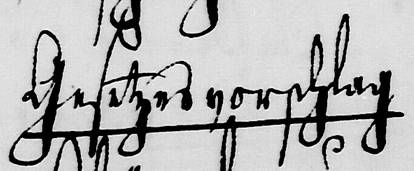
Gesetzesvorschlag
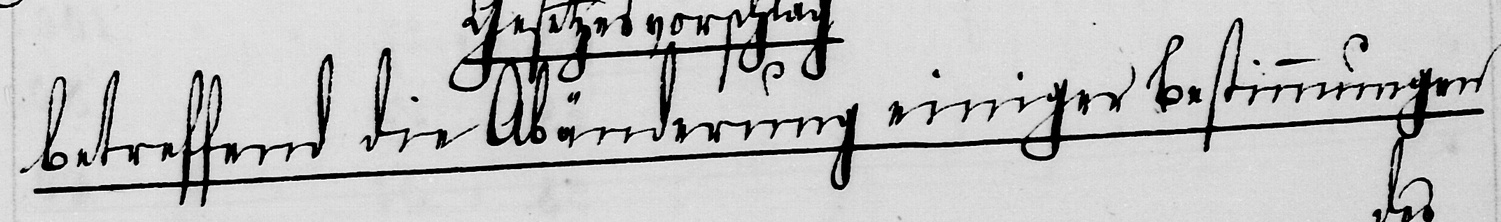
betreffend die Abänderung einiger Bestimmungen
